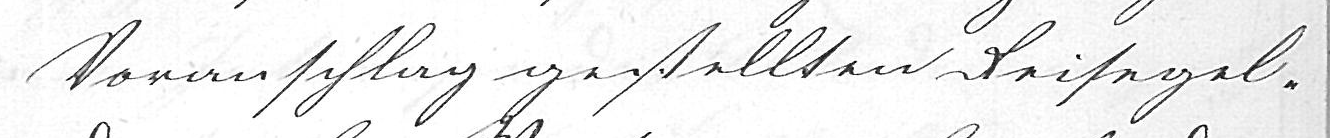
Voranschlag gestellten Reisegel-
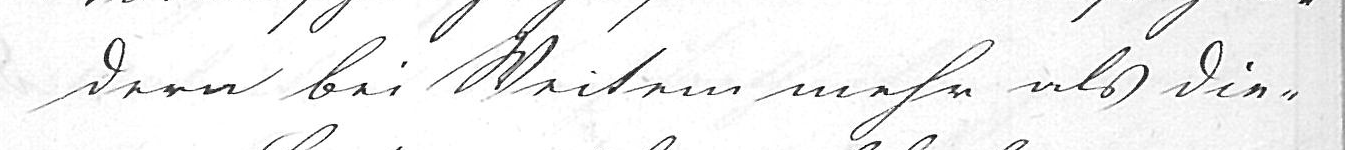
dern bei Weitem mehr als die-
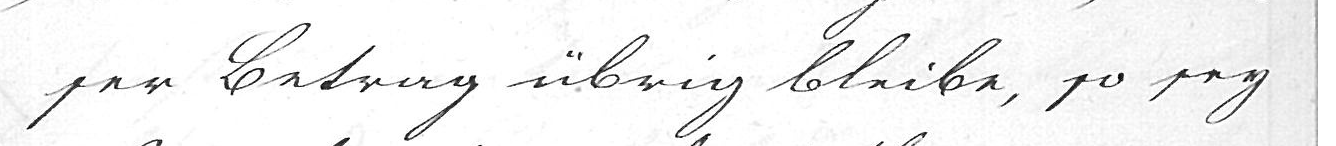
der Betrag übrig bleibe, so sey
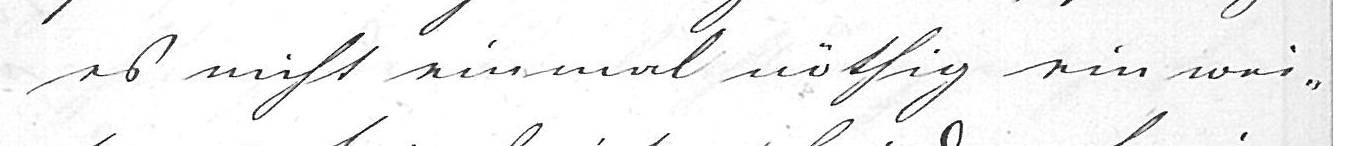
es nicht einmal nöthig ein wei-
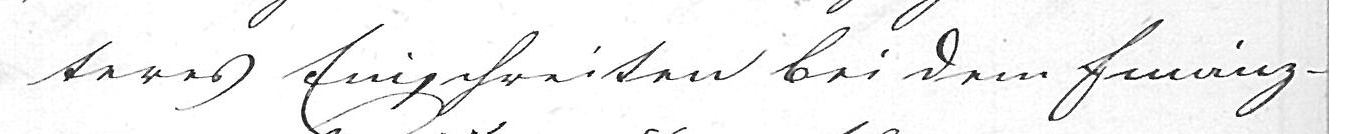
teres Einschreiten bei dem Finanz-
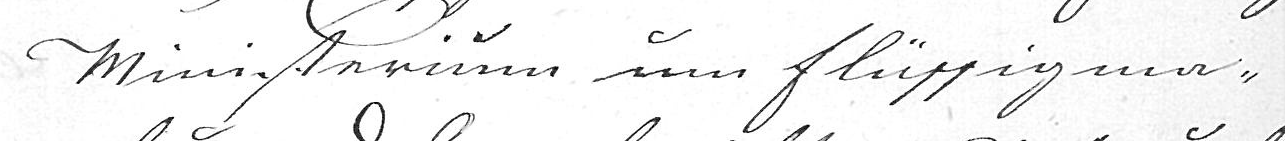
Ministerium um Flüssigma-
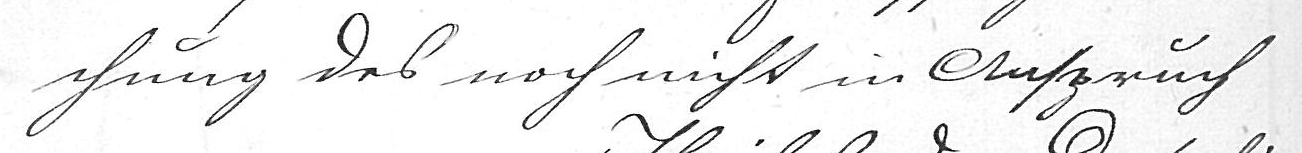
chung des noch nicht in Anspruch
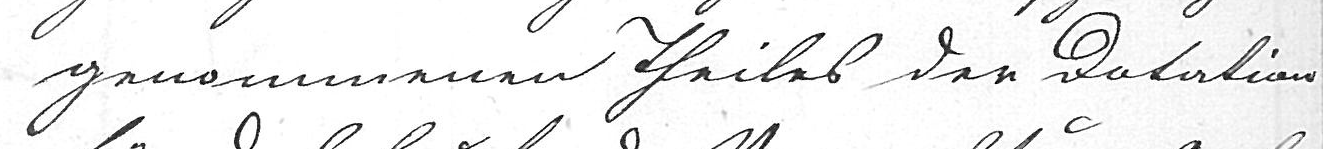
genommenen Theiles der Dotation
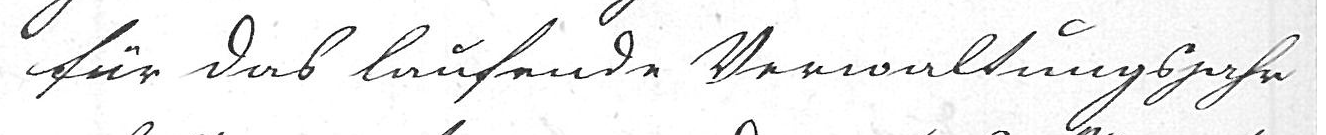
für das laufende Verwaltungsjahr
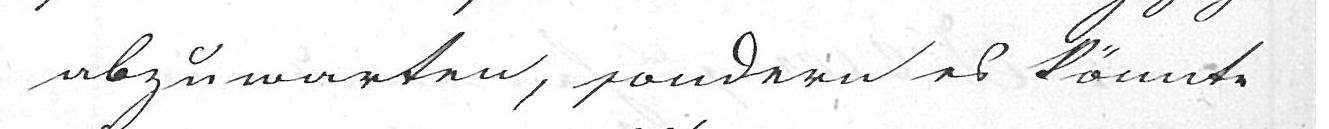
abzuwarten, sondern es könnte-
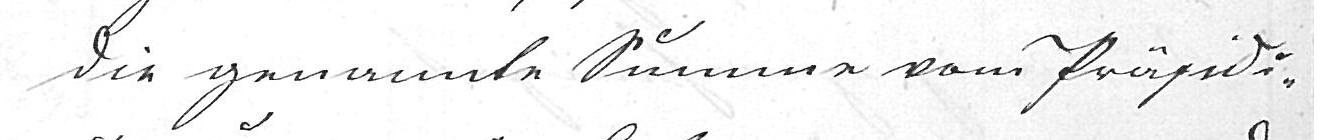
die genannten Summe vom Präsidi-
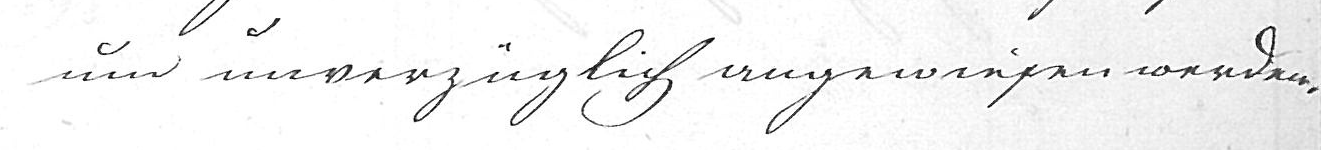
um umverzüglich angewiesen werden.
